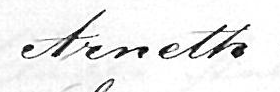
Arneth
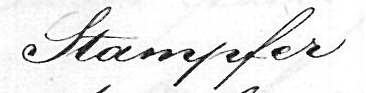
Stampfer
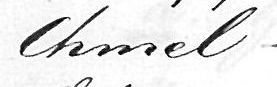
Chmel
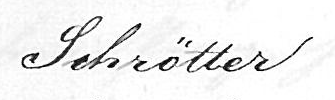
Schrötter
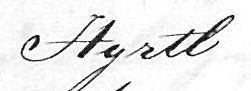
Hyrtl
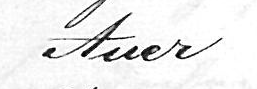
Auer
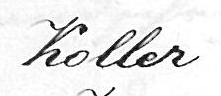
Koller
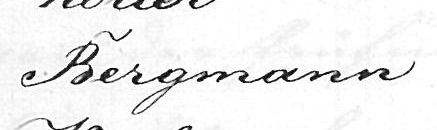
Bergmann
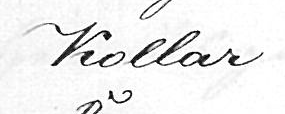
Kollar
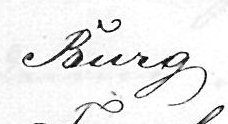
Burg
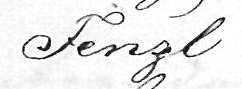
Fenzl
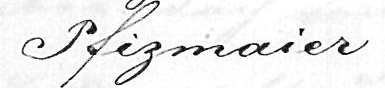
Pfizmaier
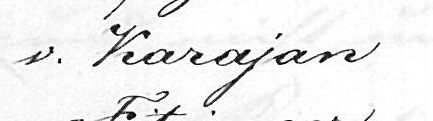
v. Karajan
